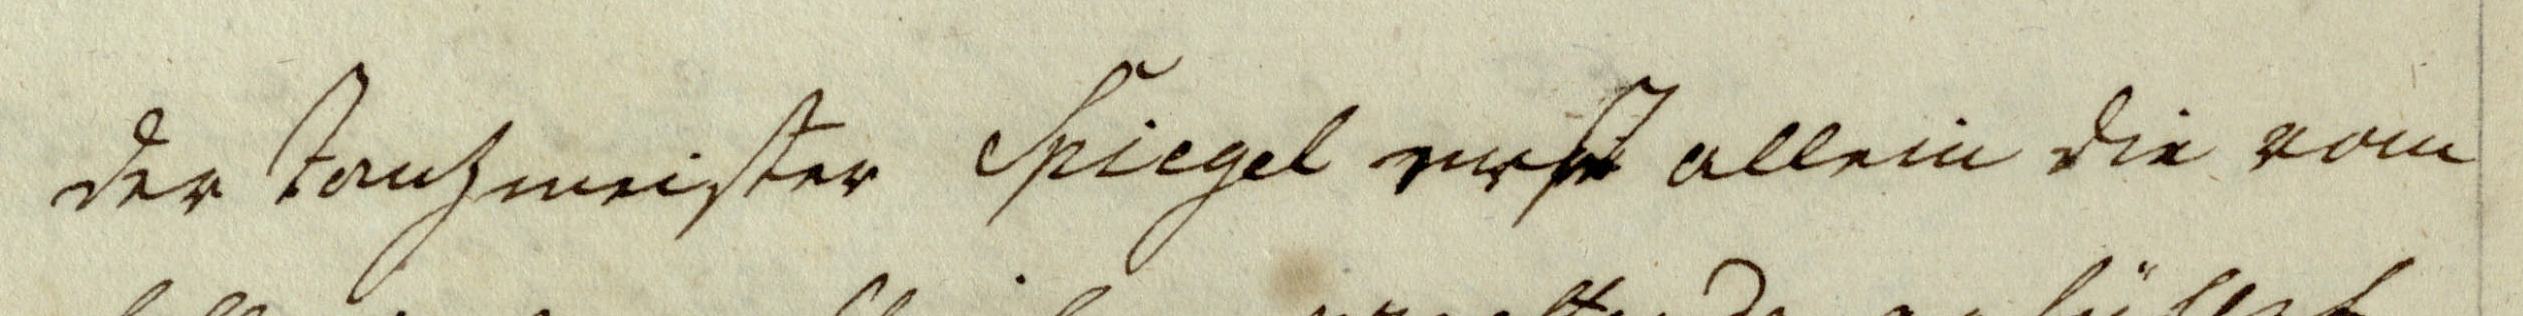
der Tanzmeister Spiegel erst allein die vom
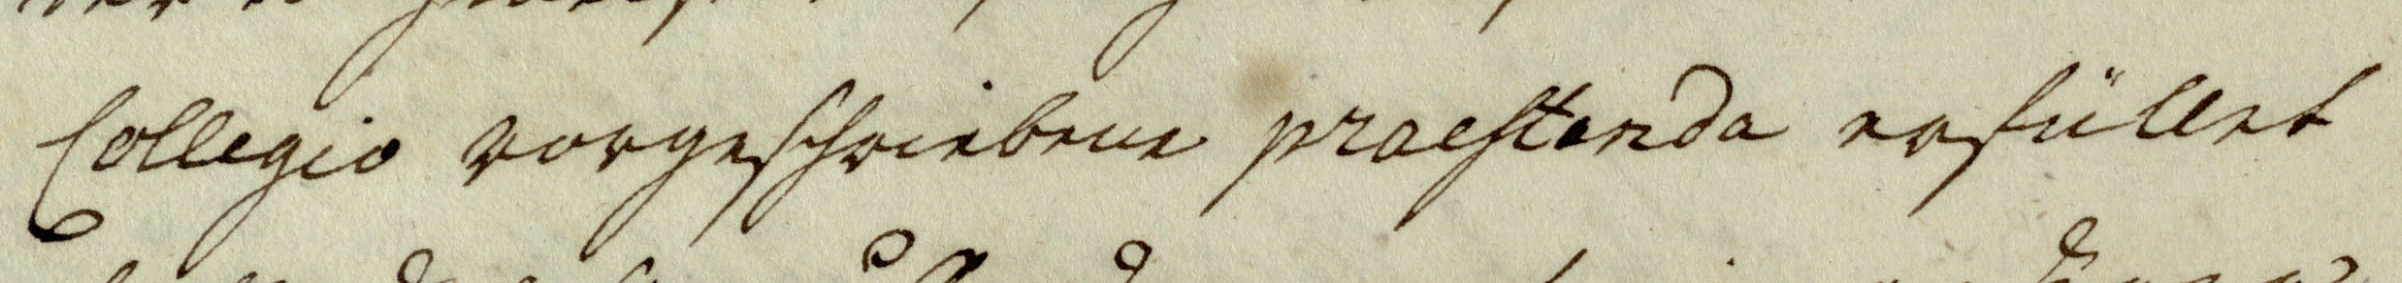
Collegio vorgeschriebene praestanda erfüllet
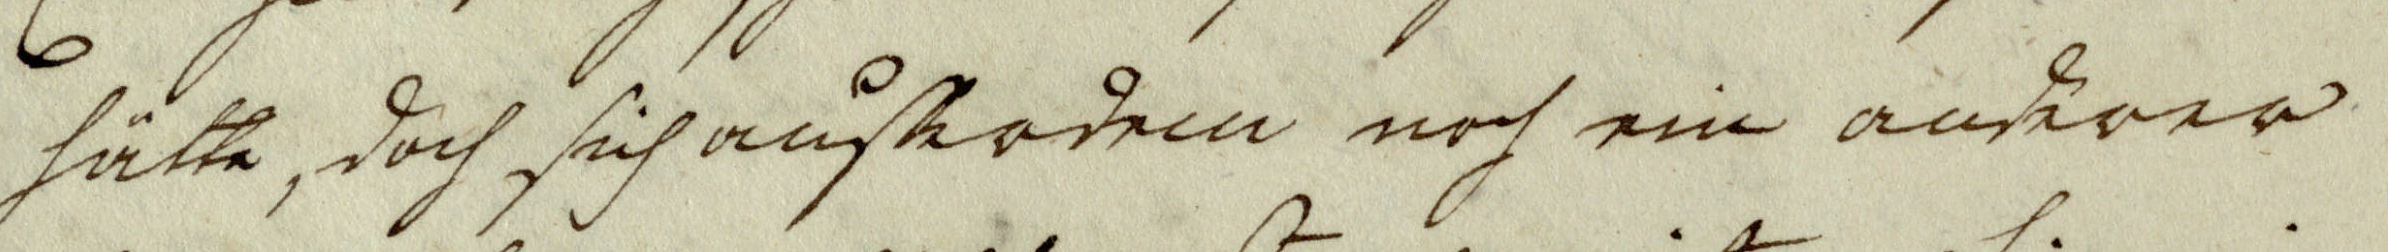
hätte, doch sich ausserdem noch ein anderer
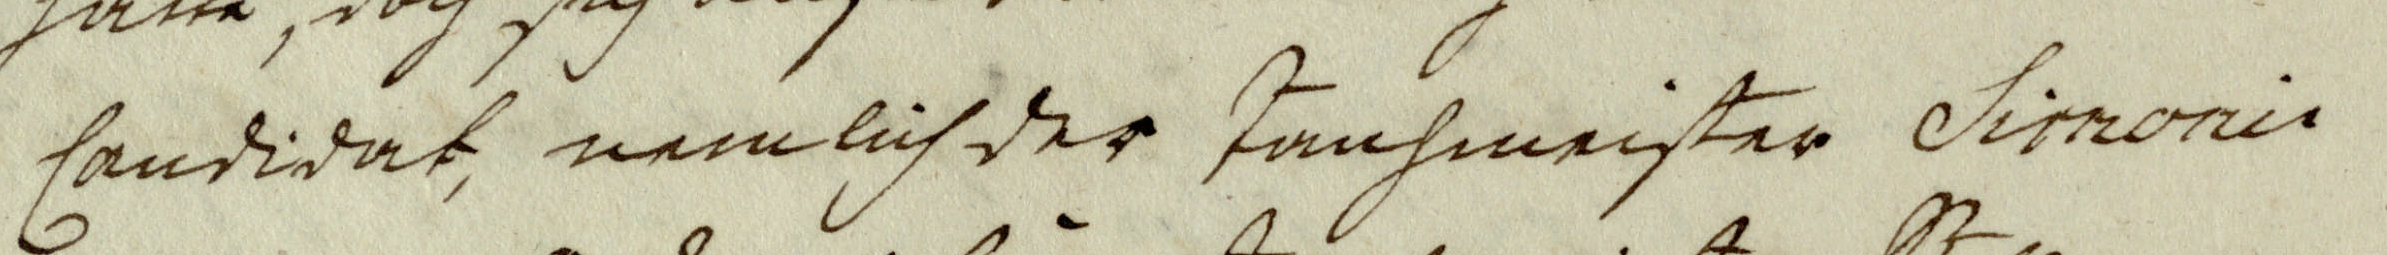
Candidat, nemlich der Tanzmeister Simoni
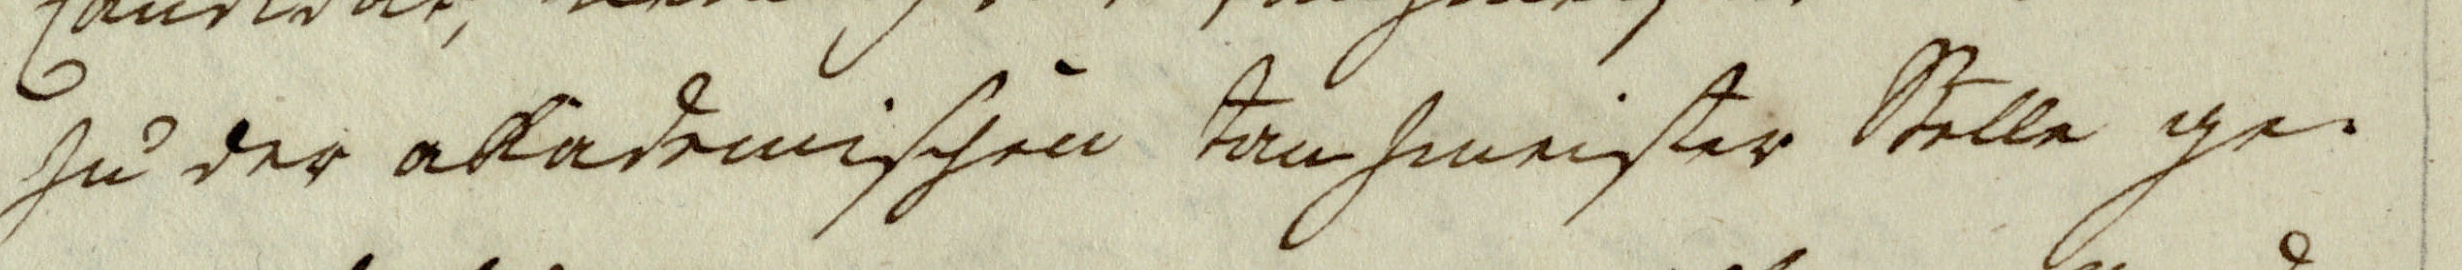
zu der akademischen Tanzmeister Stelle ge¬
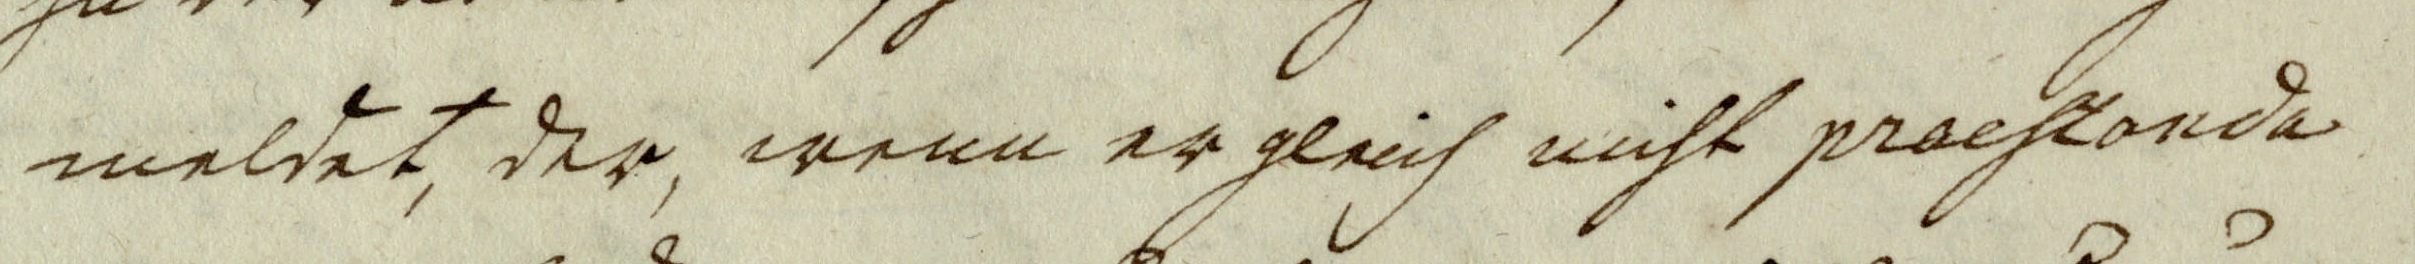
meldet, der, wenn er gleich nicht praestanda
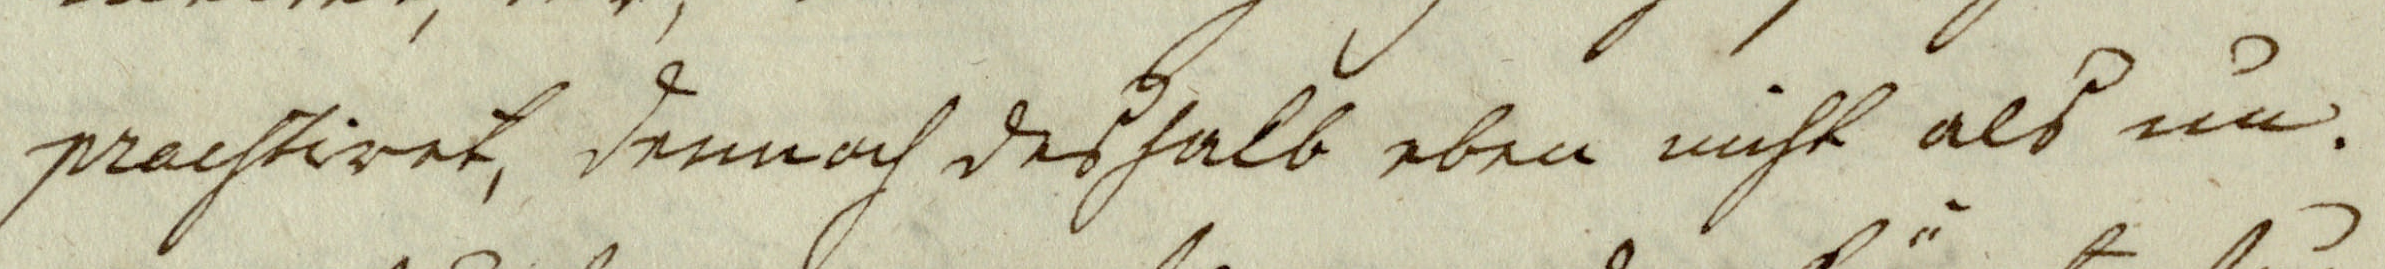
praestiret, dennoch deshalb eben nicht als un¬
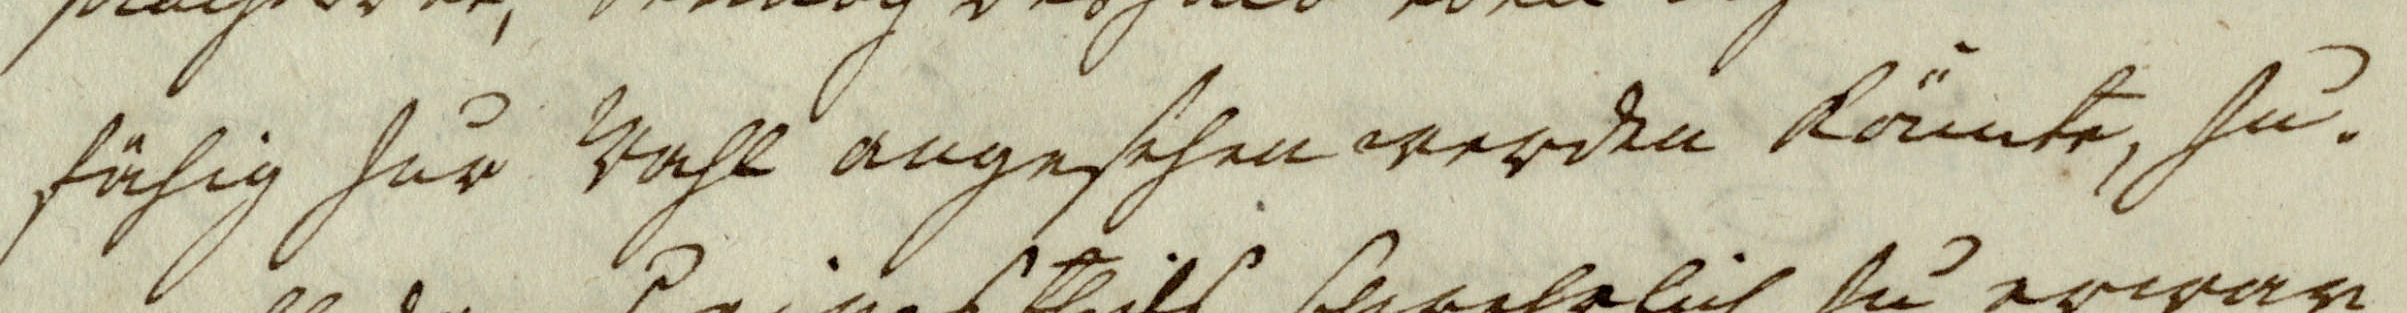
fähig zur Wahl angesehen werden könnte, zu¬
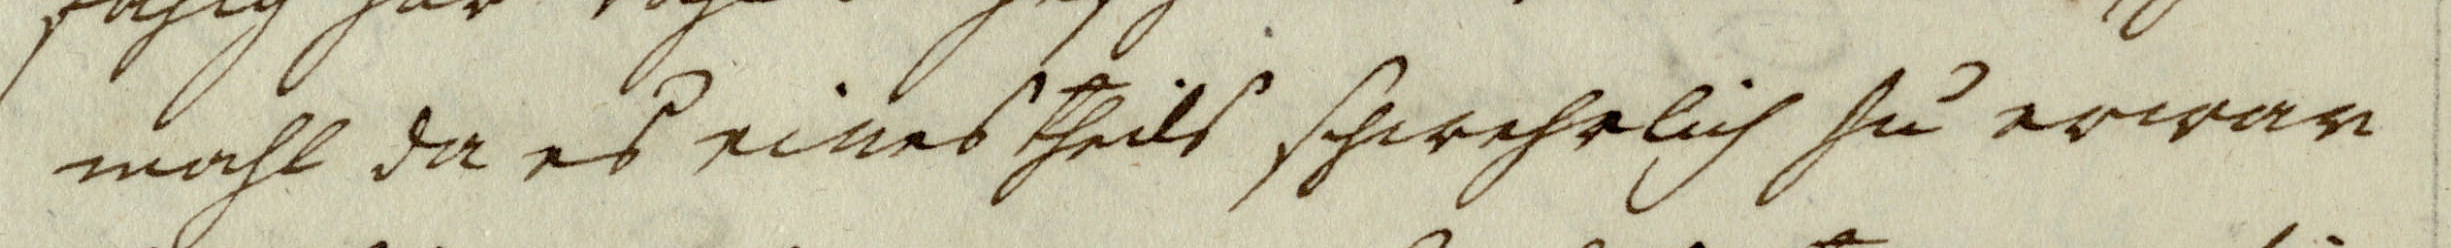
mahl da es eines theils schwehrlich zu erwar¬
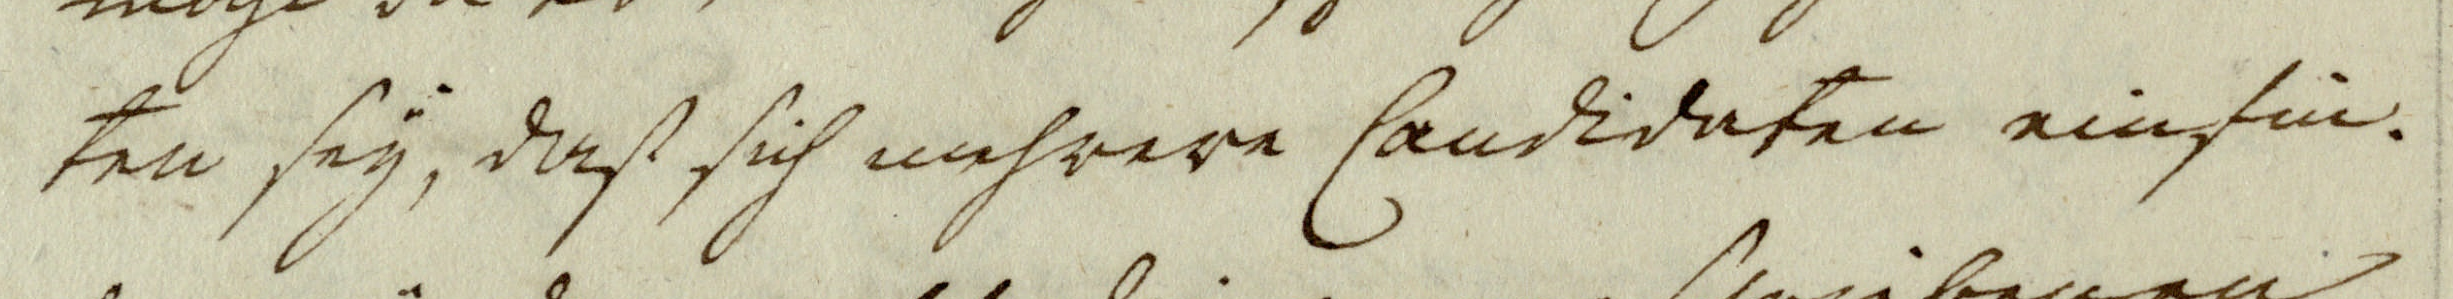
ten seÿ, daß sich mehrere Candidaten einfin¬
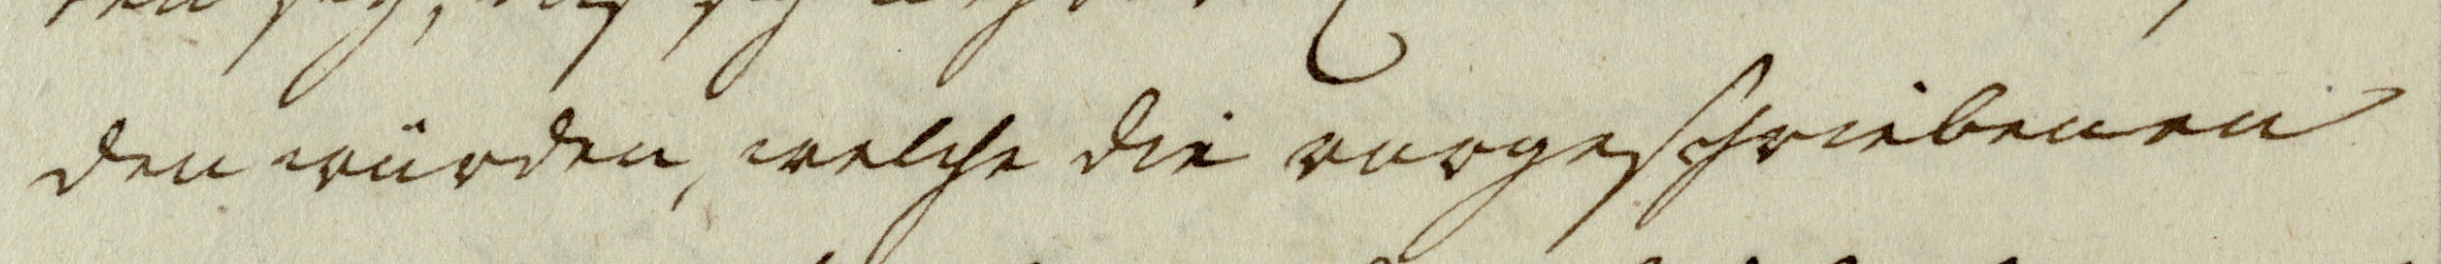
den würden, welche die vorgeschriebenen
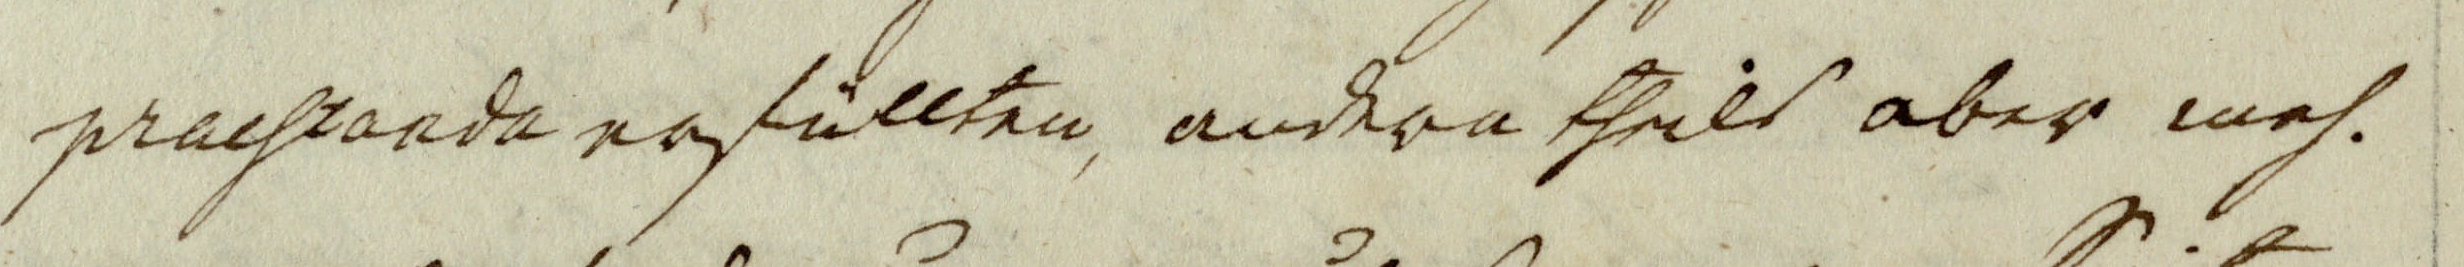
praestanda erfüllten, andern theils aber meh¬
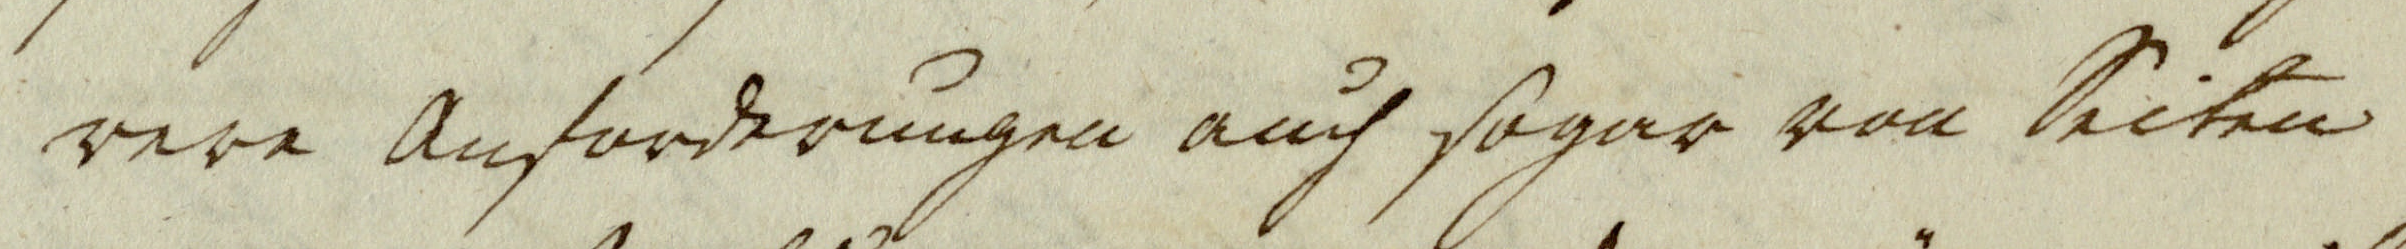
rere Anforderungen auch sogar von Seiten
